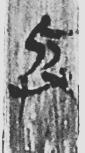兵
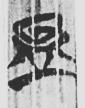昷
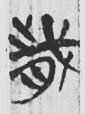歲
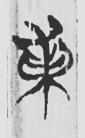{木𦥑}
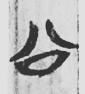公
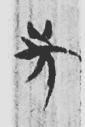先
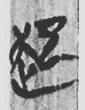起
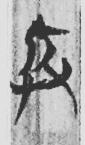兵
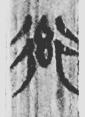率
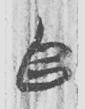𠂤
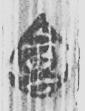會
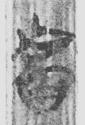者
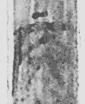侯
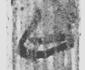㠯（以）
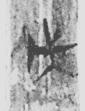伐
